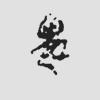睘
